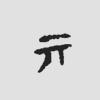亓（其）
